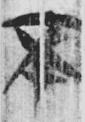不
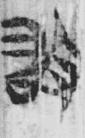敢
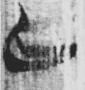㠯（以）
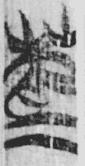蒼（寒）
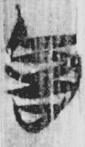○（辭）
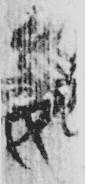○（夏）
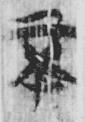不
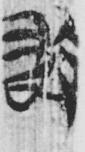敢
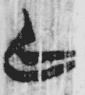㠯（以）
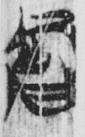暑
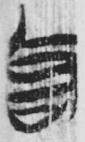○（辭）
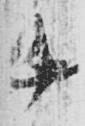身
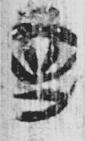言
